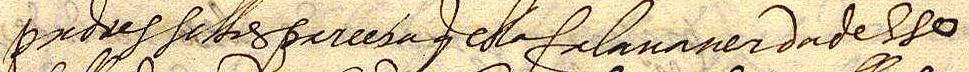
padres se lhes parecia q̄ ella falaua uerdade E se
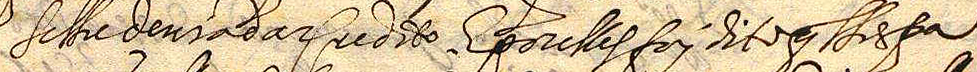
se lhe deuia dar Credito. E por elles foy dito q̄ lhes pa
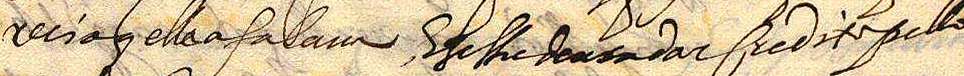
recia q̄ ella a falaua, E se lhe deuia dar Credito pello
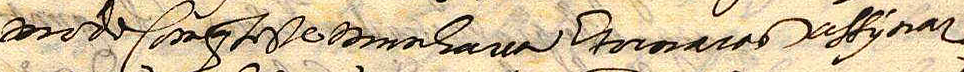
modo Com q̄ testemunhaua E tornaraõ assynar
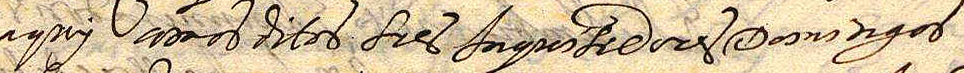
aquy com os ditos sres̄ Inquisidores Domingos
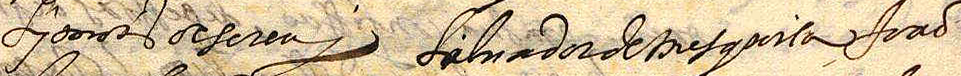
Symões o escreuj saluador de mesquita Joaõ
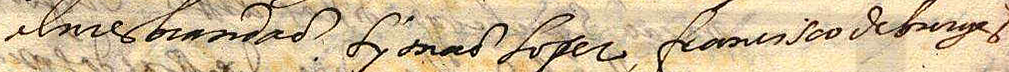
alures brandaõ symaõ Lopez, francisco de burges
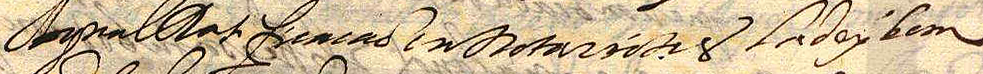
A qual ratificaçaõ eu Notario tresladey bem
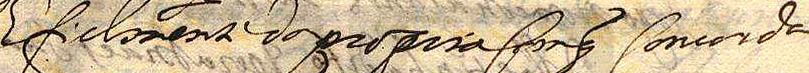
E fielmente da propria Com q̄ Concorda
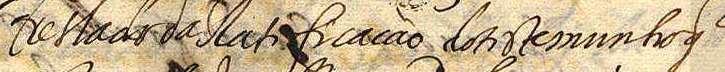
Treslado da Ratificação do testemunho q̄
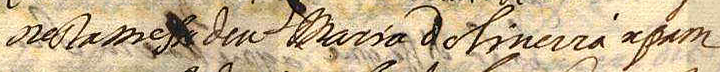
nesta mesa deu Maria doliueira xpam
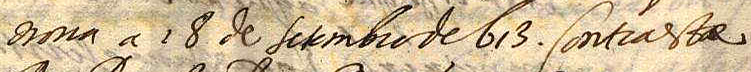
noua a 28 de setembro de 613. Contra este
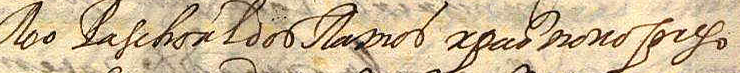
Reo Paschoal dos Ramos xpaõ nouo preso
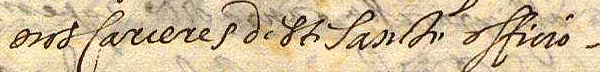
nos Carceres deste Sto Sancto officio.
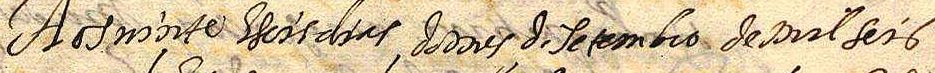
Aos uinte E seis dias do mes de Setembro de mil seis
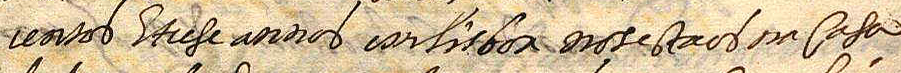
centos E trese annos em lisboa nos estaos na Casa
